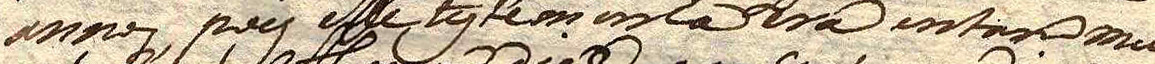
annos, pois elle testemunha era entam mu
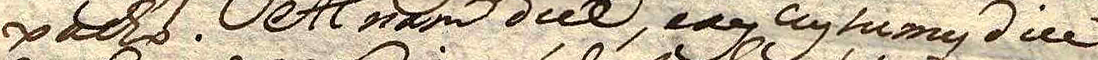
xacho. Al nam diçe, e aos custumes diçe
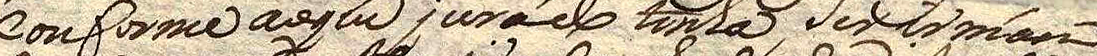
conforme ao que jurado tinha, ser irmam
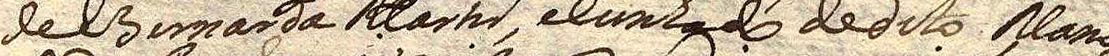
de Bernarda Martir, e cunhado do dito Mano
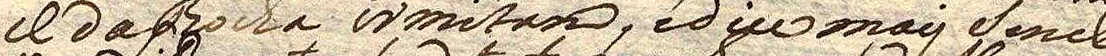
el da Rocha irmitam, dice mais sendo
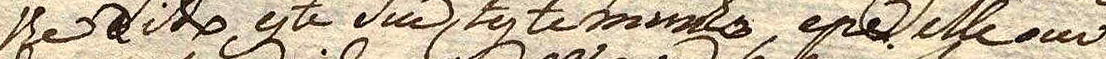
lhe Lido este seu testemunho, e por elle ouvi
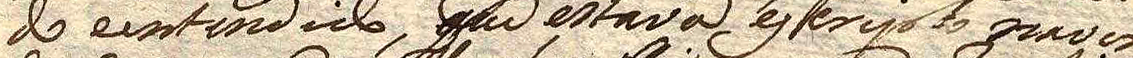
do e intendido, que estava escripto na ver
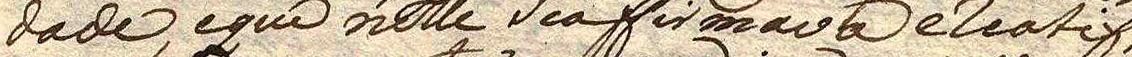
dade, e que nelle se afirmava e Reatifi
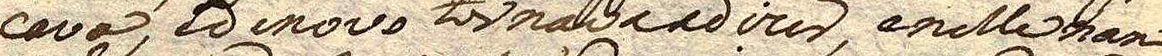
cava, e de novo tornava a dizer, e nelle nam
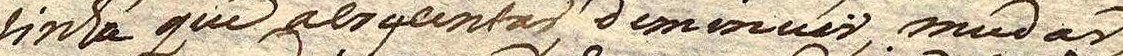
tinha que acrescentar, deminuir, mudar,
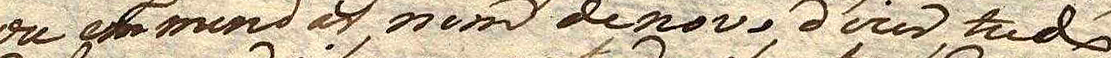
ou emmendar, nem de novo dizer, tudo
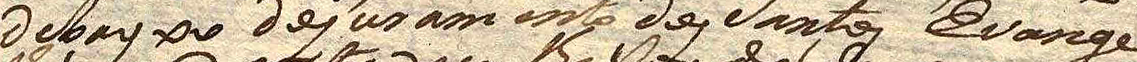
debayxo do juramento dos santos Evange
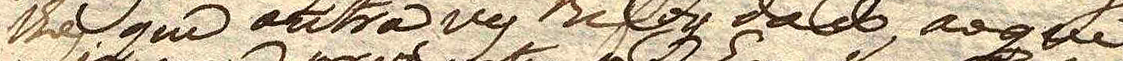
lhos que outra ves lhe foy dado, ao que
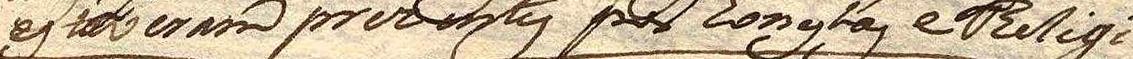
estiveram prezentes por honestas e Religi
